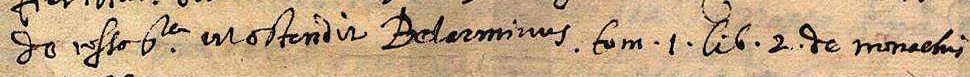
de nossa s.ra ut ostendit Belarminus. tom. 1. lib. 2. de monachis
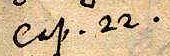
cap. 22.
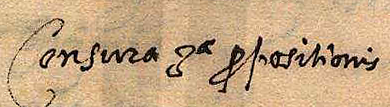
Censura 3a ꝓpositionis.
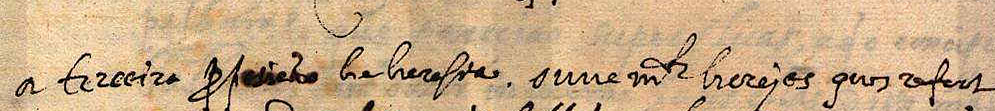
a terceira ꝓposiçaõ he heresia. ouue m.tos herejes quos refert
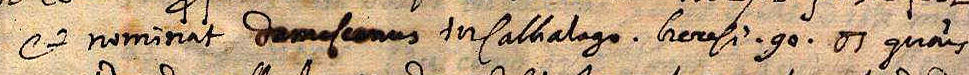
& nominat damascenus in Cathalogo. heresi. 90. os quaes
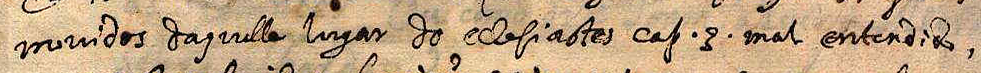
mouidos daquelle lugar do eclesiastes cap. 3. mal entendido,
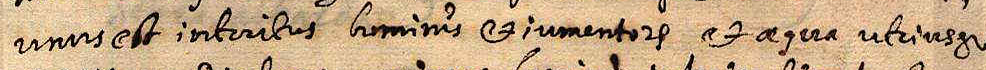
unus est interitus hominis & iumentoꝝ & æqua utriusque
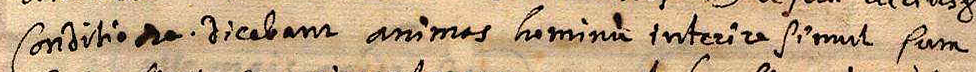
Conditione dicebant animas hominū interire simul Cum
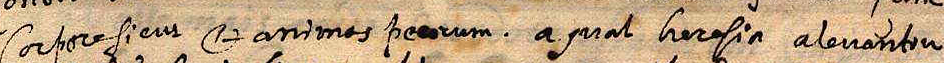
Corpore sicut & animas pecarum. a qual heresia aleuantou
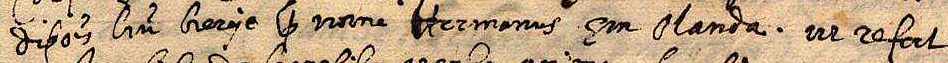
dipois hū hereje p̄o nome Hermanus Em Olanda. ut refert
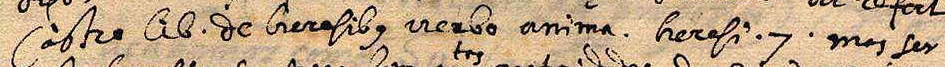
Castro lib. de heresibꝯ uerbo anima. heresi. 7. mas ser
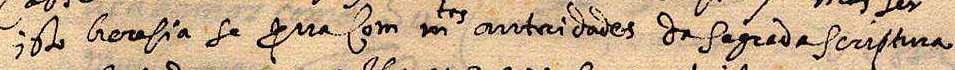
isto heresia se ꝓua Com mtas autoridades da sagrada scriptura
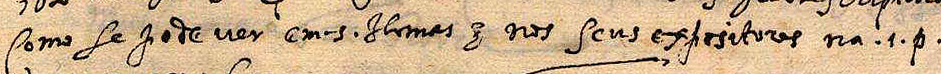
Como se pode uer em s. Thomas E nos seus expositores na .1. p.
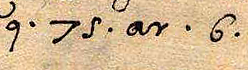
9. 75. ar. 6.
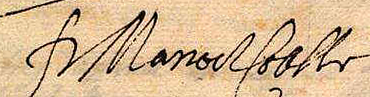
fr Manoel Coelho
